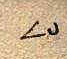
10
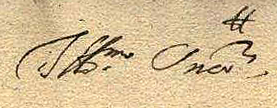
Ill.mo Snōr
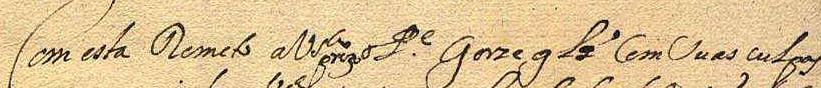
Com esta Remeto a Vsa prezo o P.e Gorze glz̄ Com Suas culpas
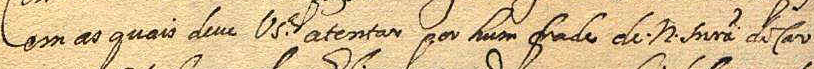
em as quais deue Vs.a atentar por hum frade de N. Snrā do Car
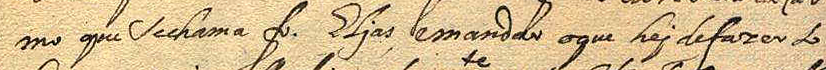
mo que se chama fr. Elias, e mandar o que hej de fazer so
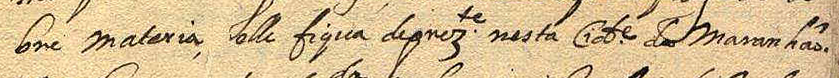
bre materia, elle fiqua de prez.te nesta Cid̄.e do Maranhaõ.
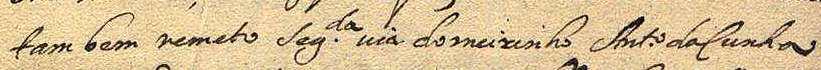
tambem remeto seg.da uia do meirinho Ant.o da Cunha
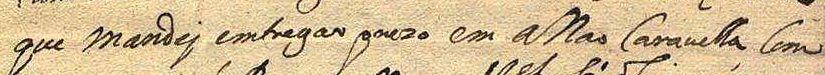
que mandej emtregar prezo em a Nao Carauella Com
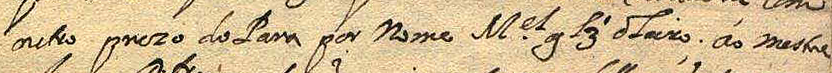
outro prezo do Para por Nome M.el glz̄ oleiro; ao mestre
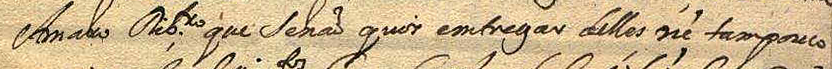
Amaro Rib.ro que se não quis emtregar delles nē tampouco
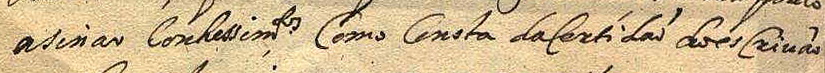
asinar Conhessim.tos Como Consta da Certidaõ do esCriuaõ
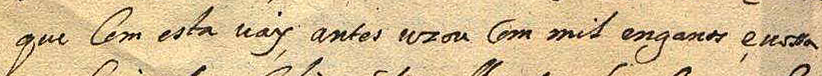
que Com esta uay, antes uzou com mil enganos, e uossa
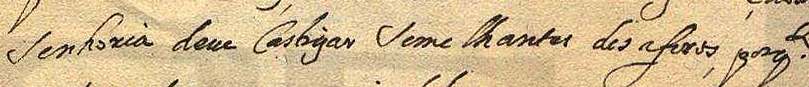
Senhoria deue Castigar Semelhantes desaforos, porq.to
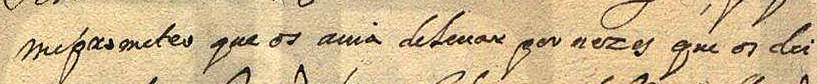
me prometeo que os auia de leuar por uezes que os dei
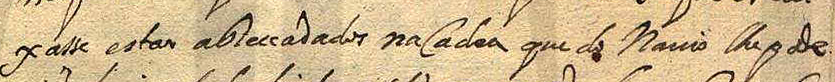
xasse estar aReccadados na Cadea que do Nauio lhe pode
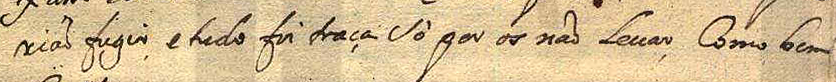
riaõ fugir, e tudo foi traça só por os não leuar, Como bem
